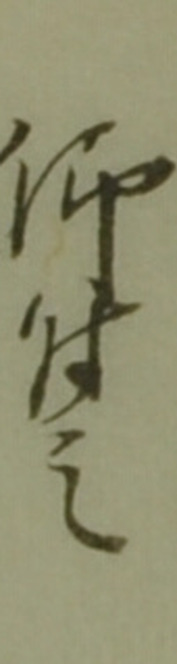仰付之
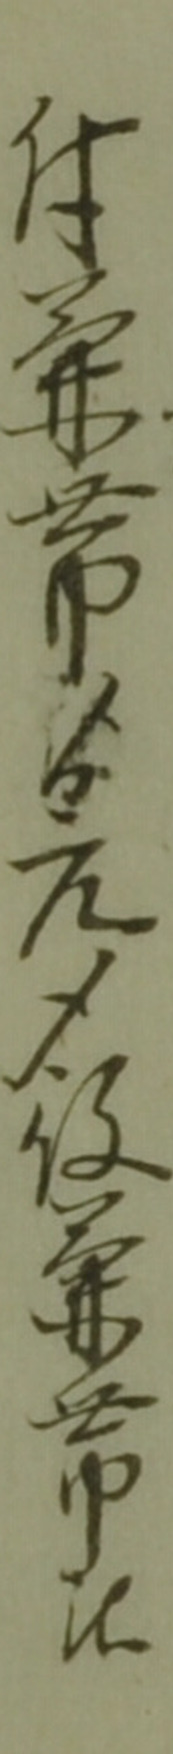付兼帯ゟ元〆役兼帯被
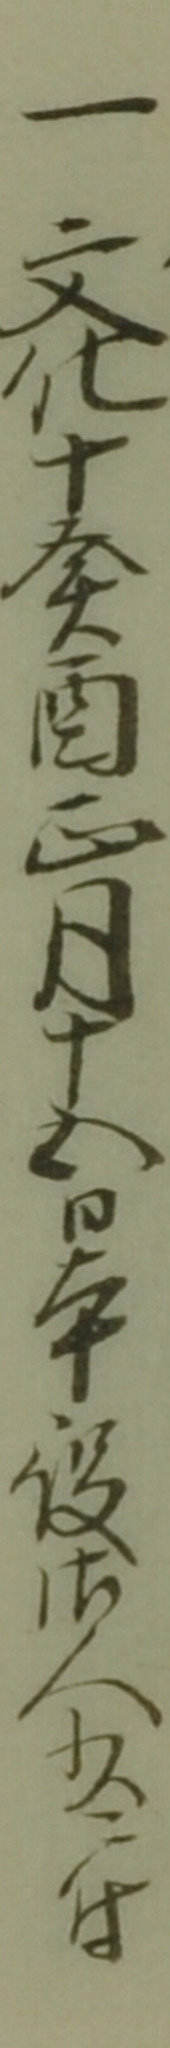一文化十癸酉正月十五日本役御人少付
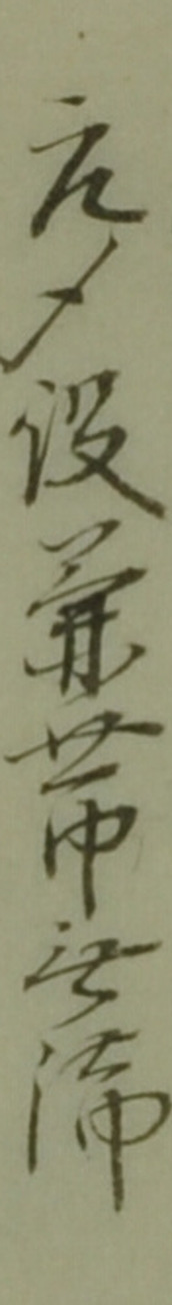元〆役兼帯無滞
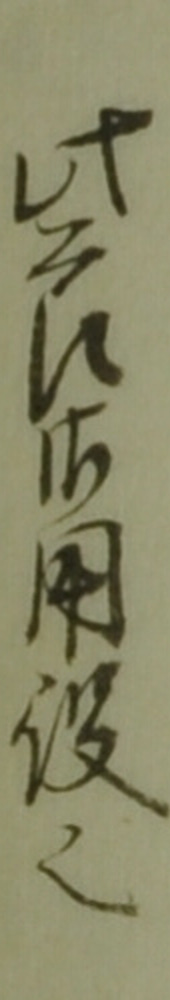此節御用役也
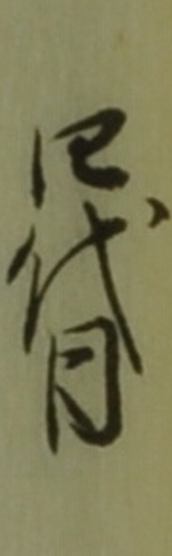四代目
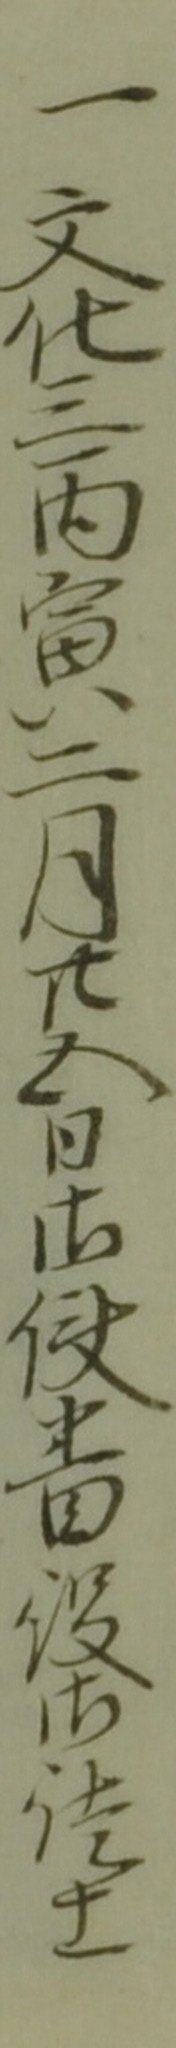一文化三丙寅二月廿五日御使番役御徒士
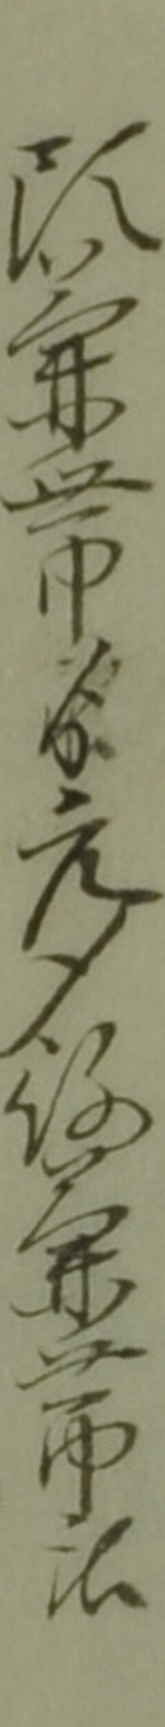頭兼帯ゟ元〆役兼帯被
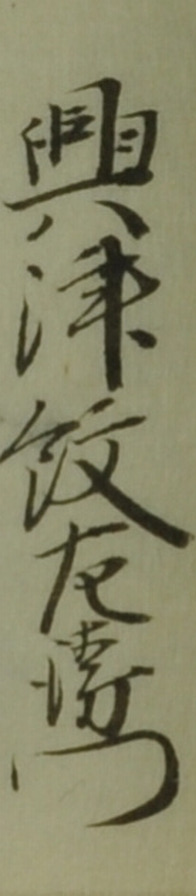奥津紋左衛門
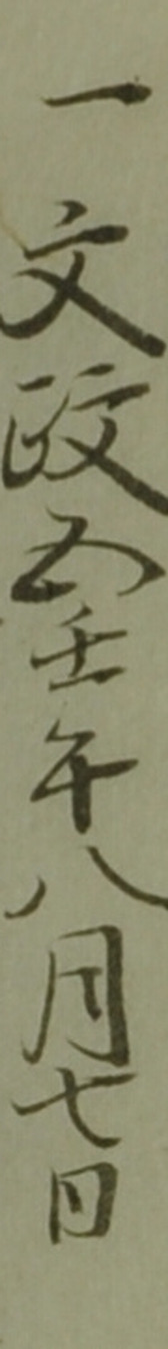一文政五壬午八月七日
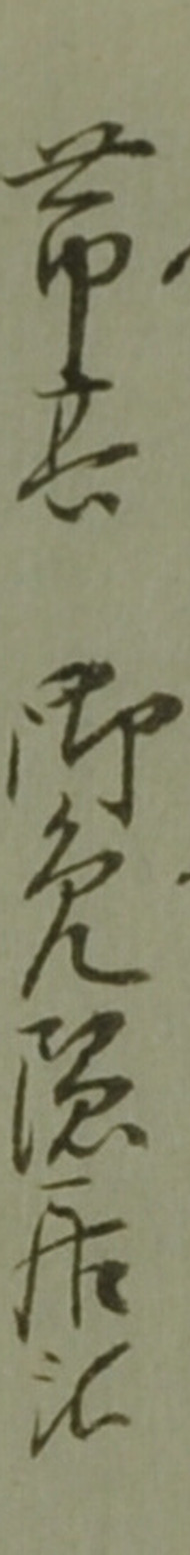帯共御免隠居被
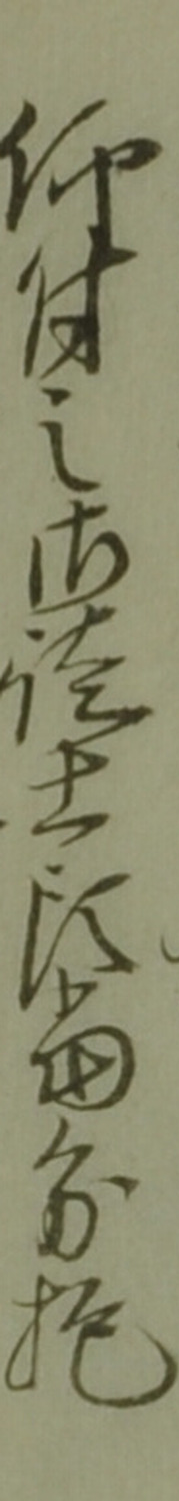仰付之御徒士頭当分抱
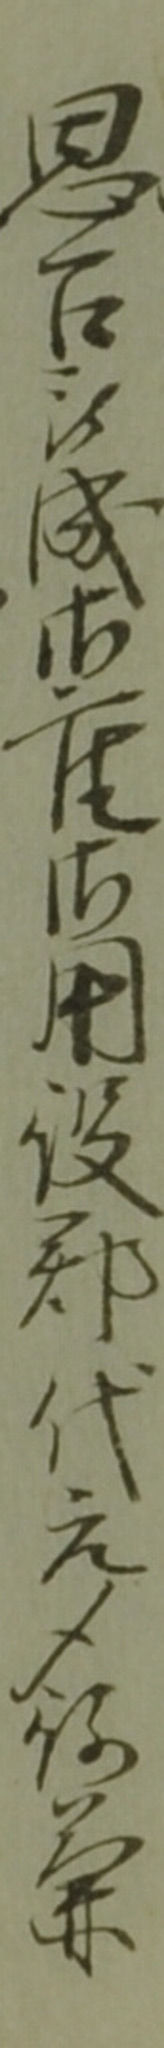思召被成御座御用役郡代元〆役兼
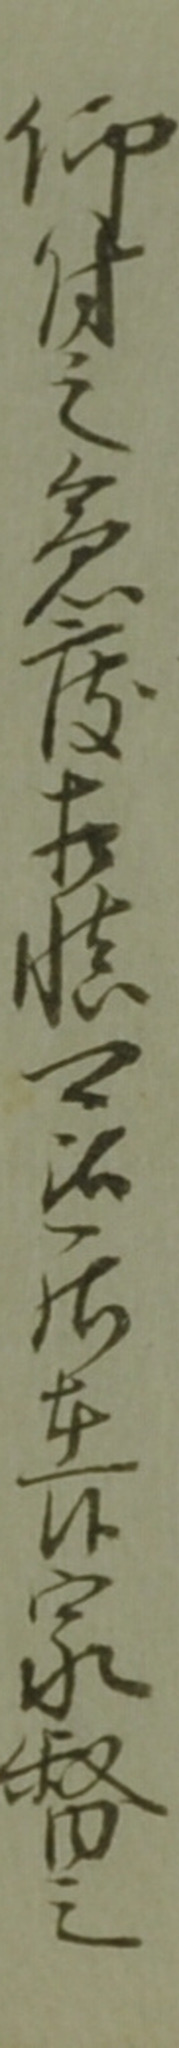仰付之急度相慎可被居在候家督之
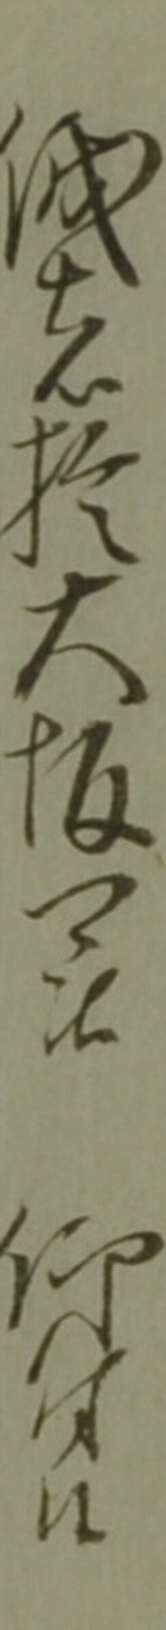儀者於大坂可被仰付候
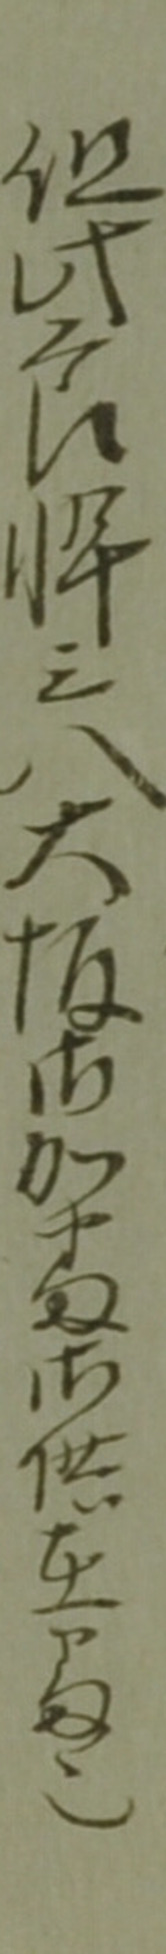但此節忰三八大坂御加番御供在番也
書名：諸御役代々録（七）
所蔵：伊那市立高遠町図書館・合同会社AMANE
